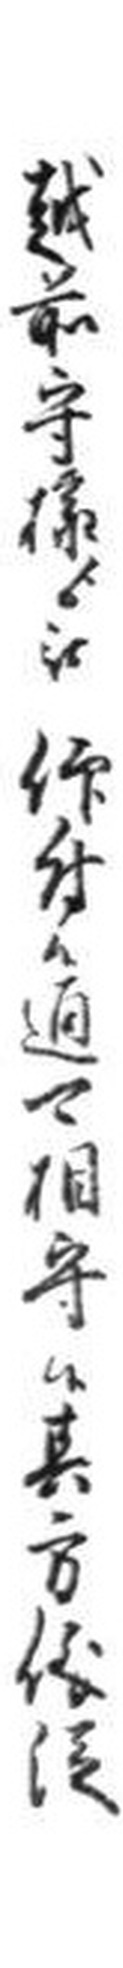越前守様ゟ被仰付候通可相守候其方儀従
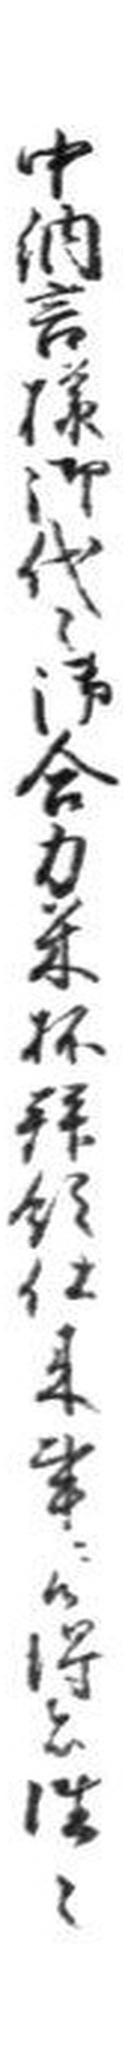中納言様御代々御合力米等拝領仕来事ニ候得者往々
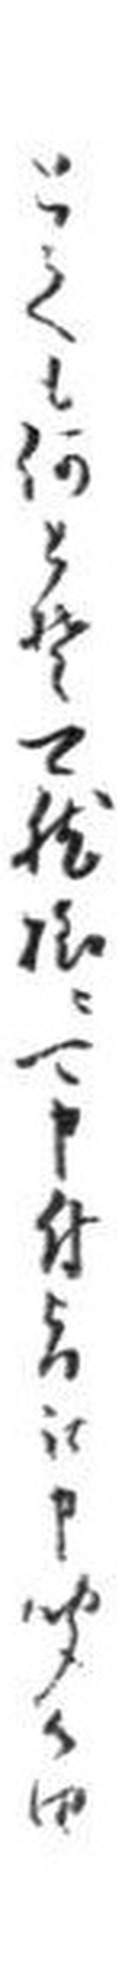とても何とそ可然様ニ可申付旨被申聞候由
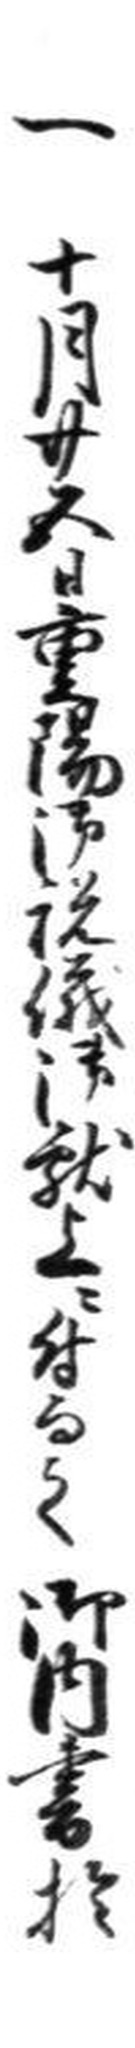一十月廿五日重陽御祝儀御献上ニ付而之御内書於
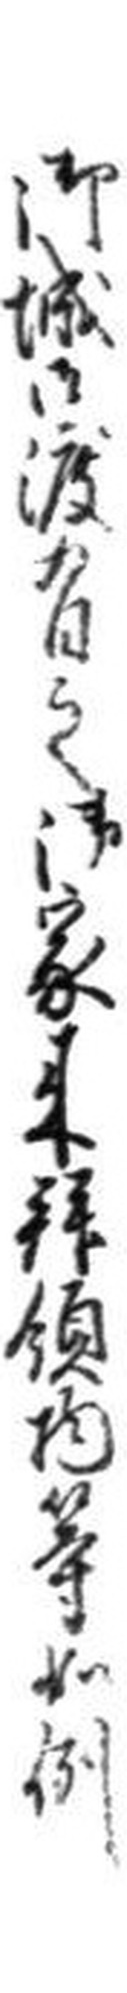御城御渡有之御家来拝領物等如例
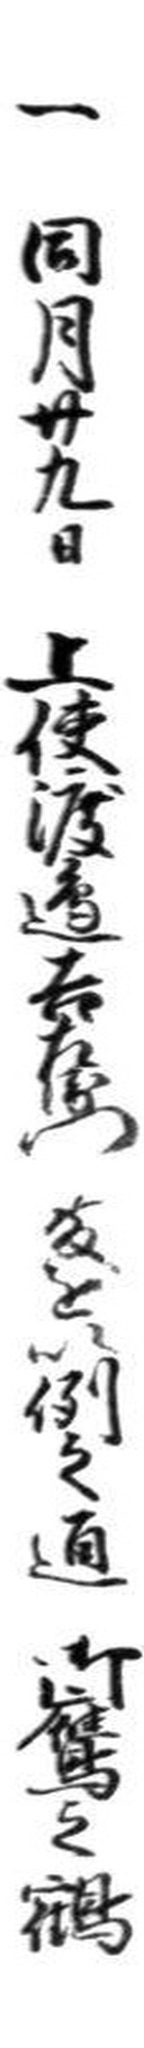一同月廿九日上使渡辺吉左衛門殿を以例之通御鷹之鶴
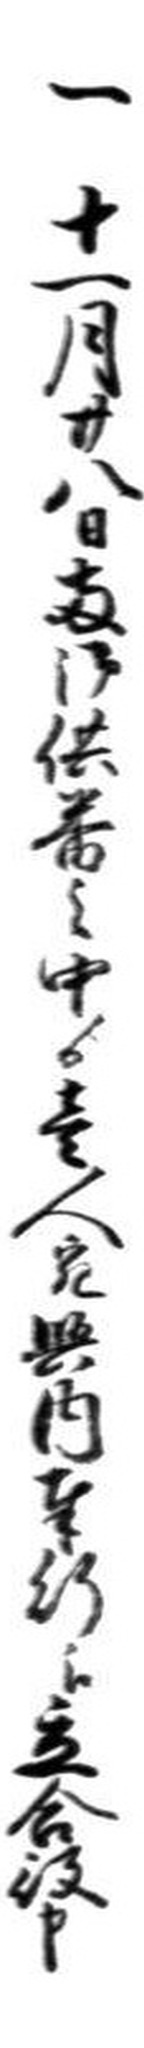一十一月廿八日両御供番之中ゟ壱人宛与内奉行江立合役申
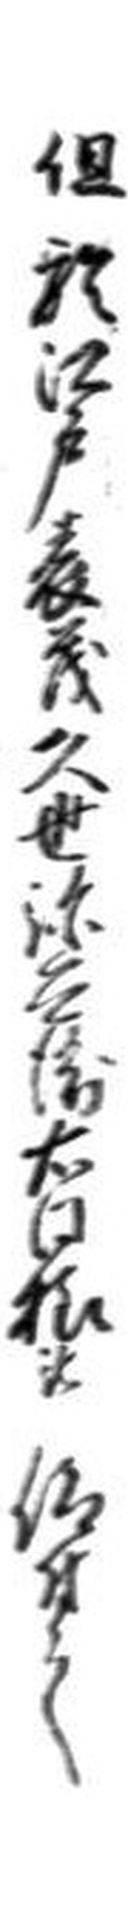但於江戸表も久世弥兵衛右同様被仰付之
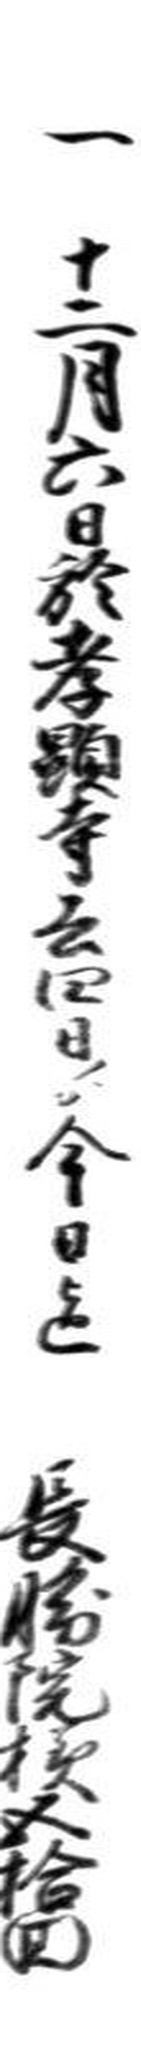一十二月六日於孝顕寺去四日ゟ今日迄長勝院様五拾回
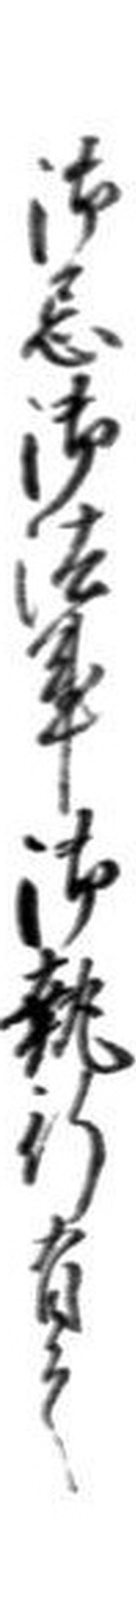御忌御法事御執行有之
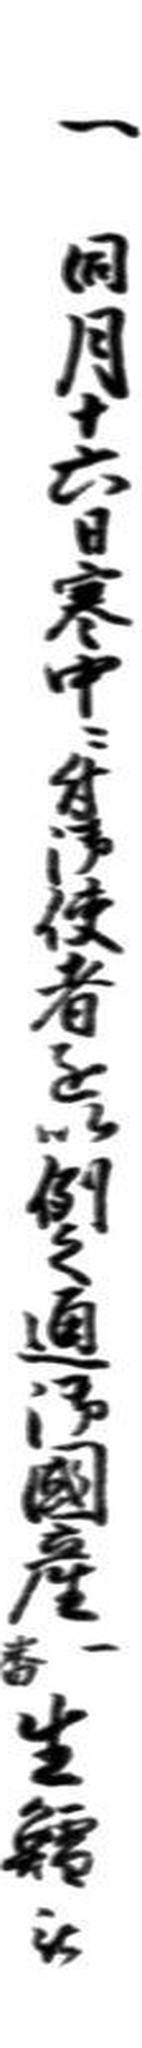一同月十六日寒中ニ付御使者を以例之通御国産一番生鱈被

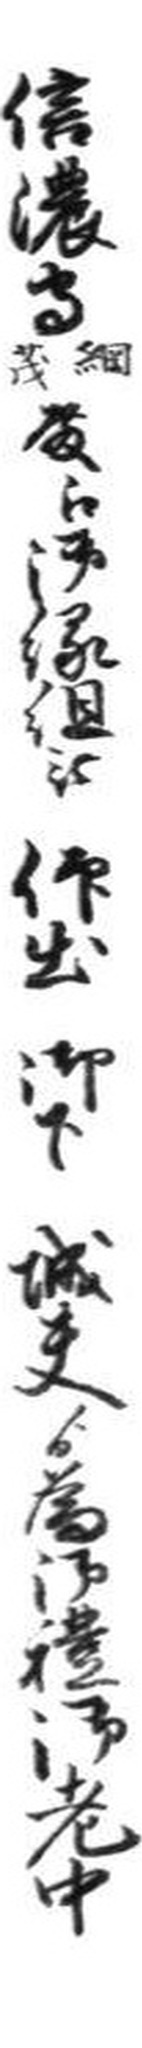信濃守綱茂殿江御縁組被仰出御下城夫ゟ為御礼御老中
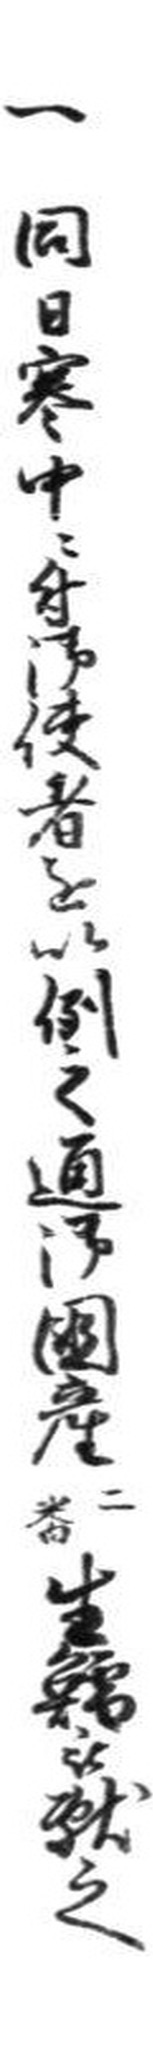一同日寒中ニ付御使者を以例之通御国産二番生鱈被献之
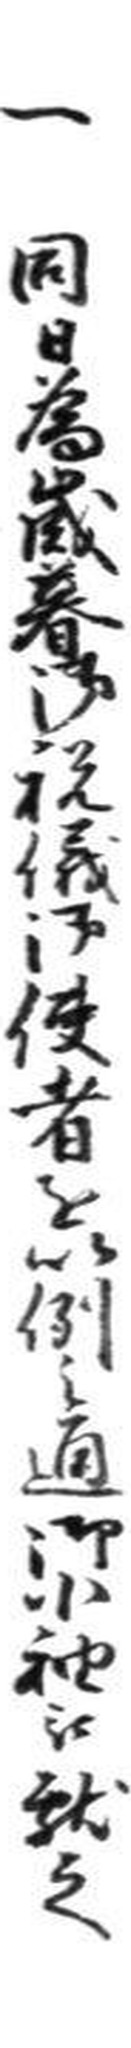一同日為歳暮御祝儀御使者を以例之通御小袖被献之
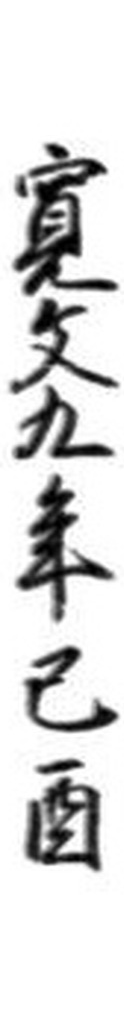寛文九年己酉
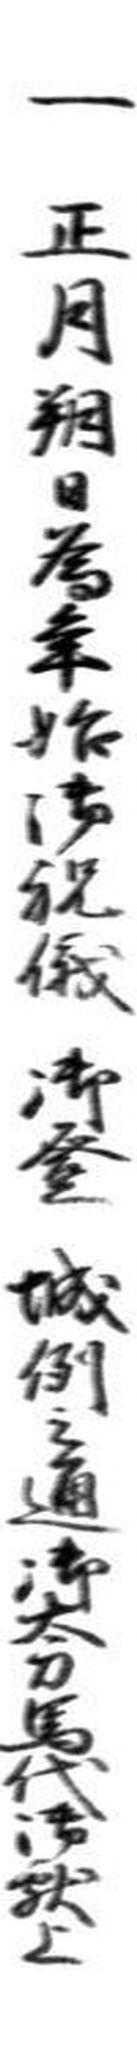一正月朔日為年始御祝儀御登城例之通御太刀馬代御献上
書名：家譜 七 光通公 従寛文四年到同九年
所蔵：福井県文書館 Fukui Prefectural Archives
